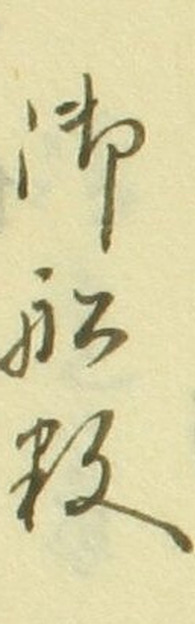御船数

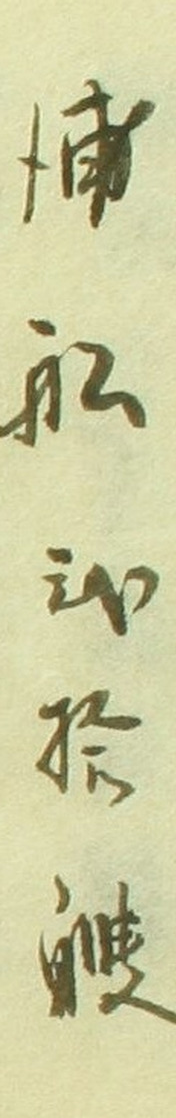浦船弐拾艘
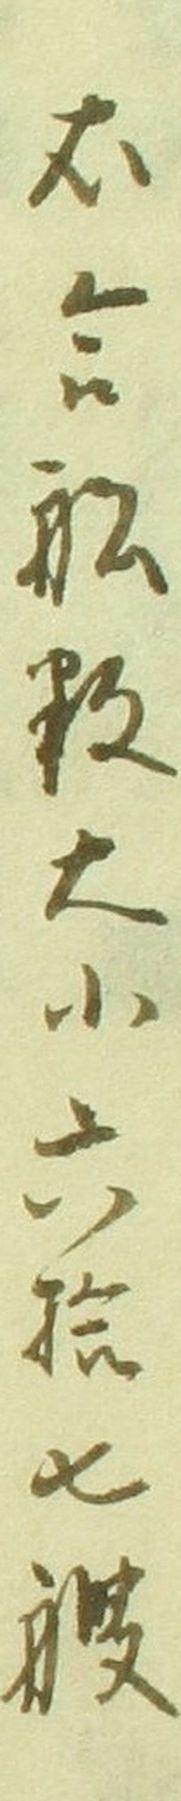右合船数大小六拾七艘
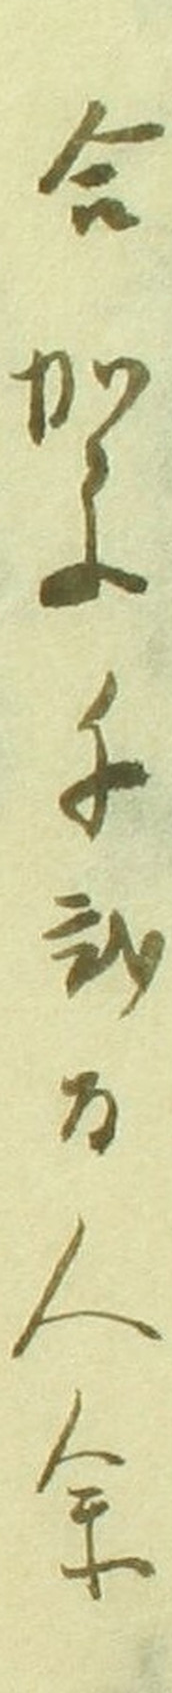合加子千弐百人余
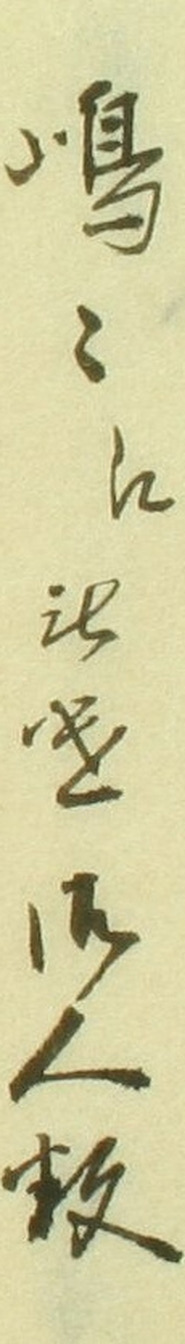島々江被遣御人数
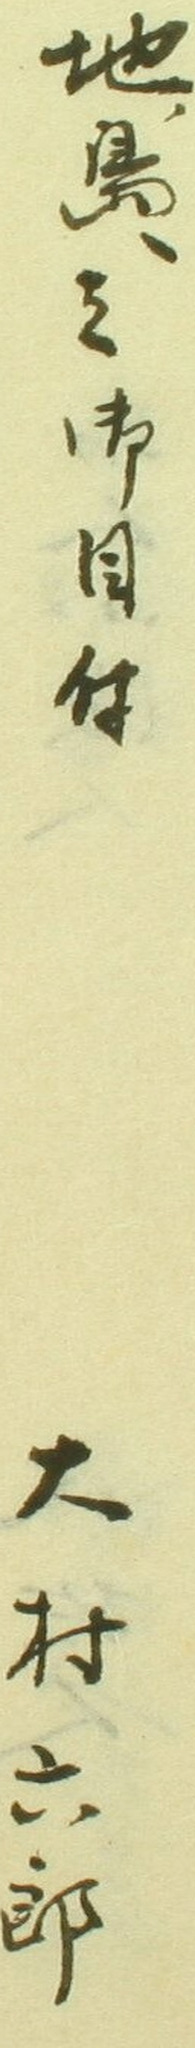地島へは御目付大村六郎
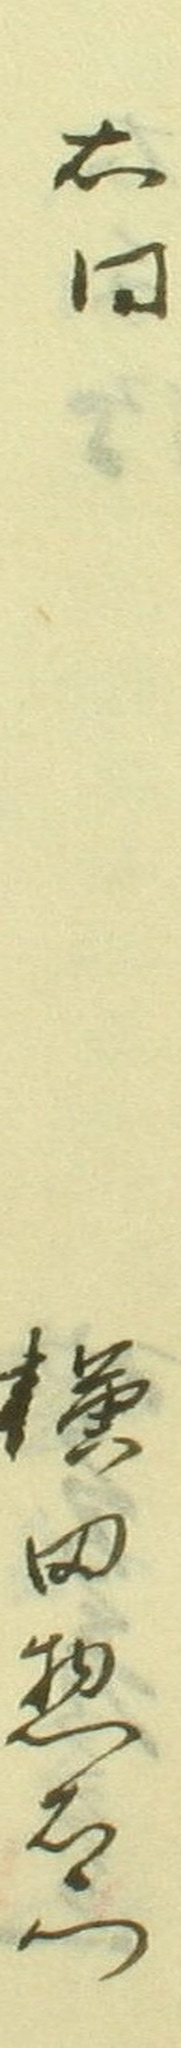右同横田惣右衛門
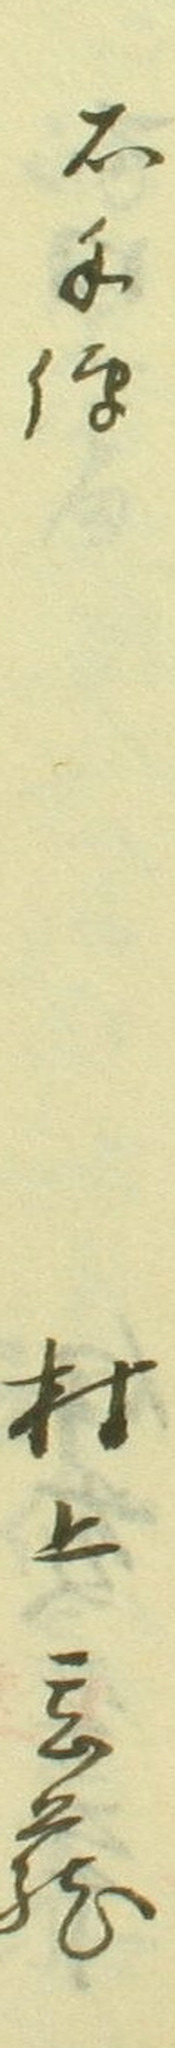右手伝村上甚蔵
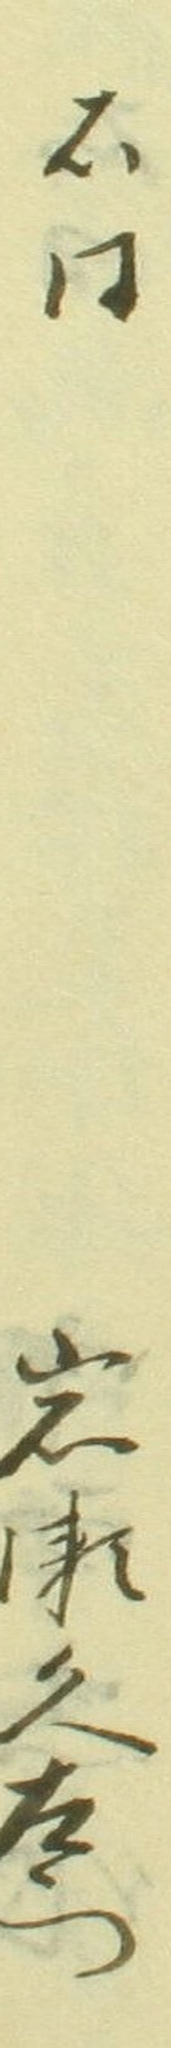右同岩瀬久左衛門
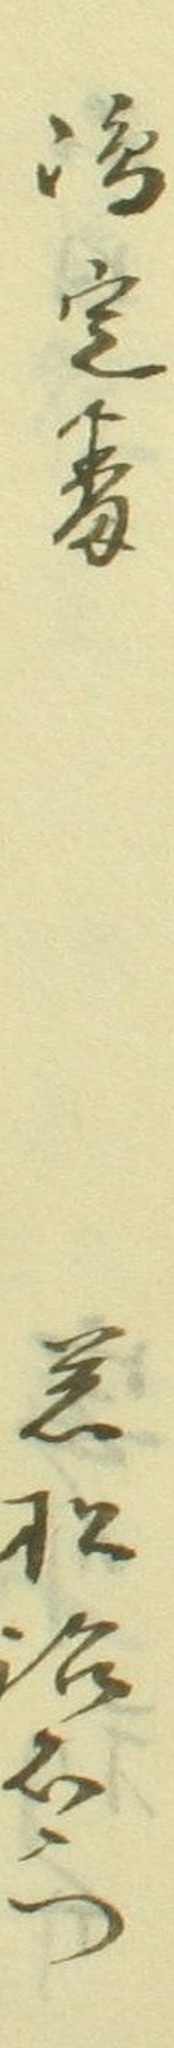島定番若松治右衛門
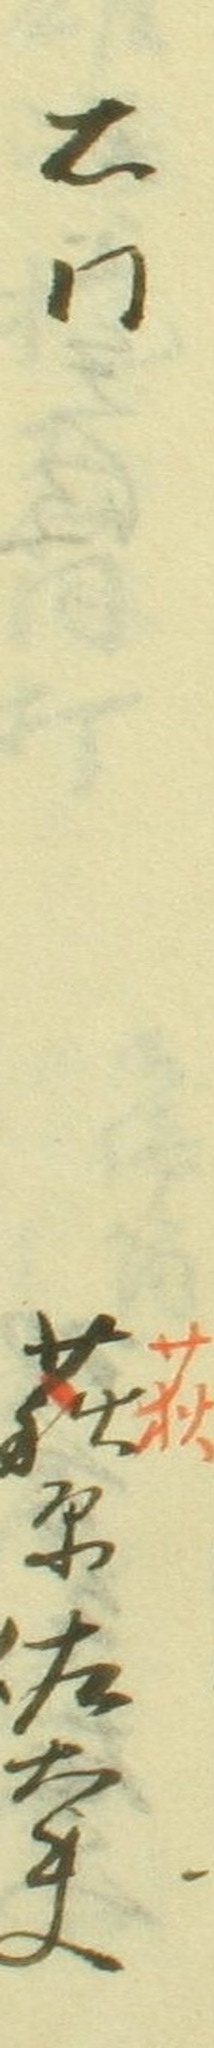右同荻原佐大夫
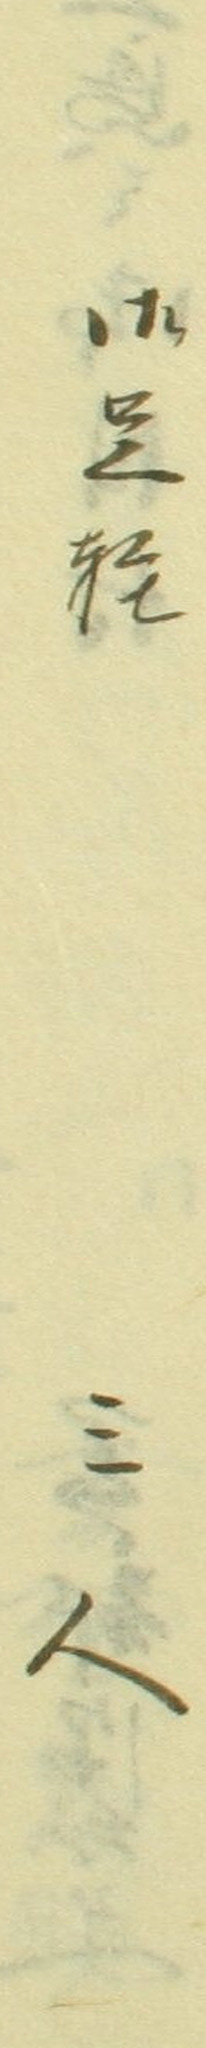御足軽三人
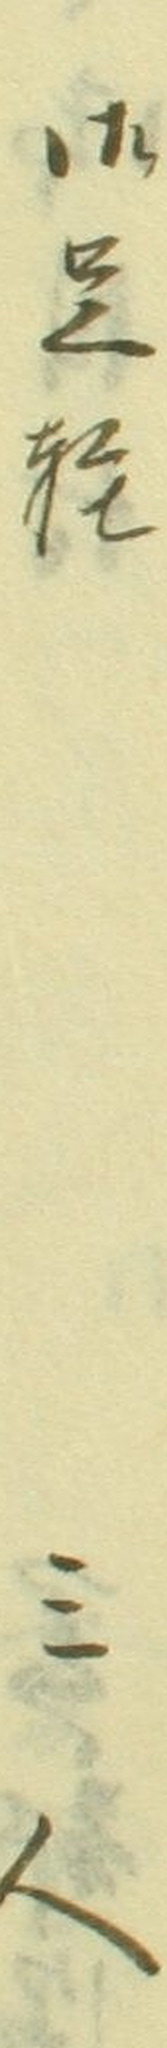御足軽三人
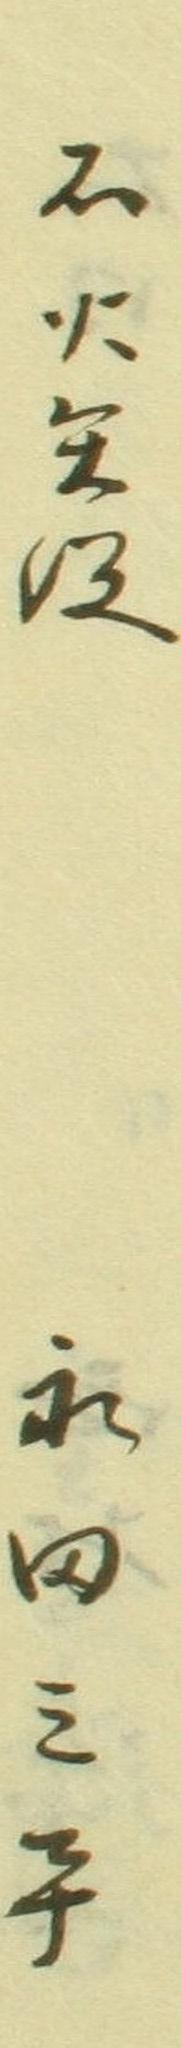石火矢役永田三平
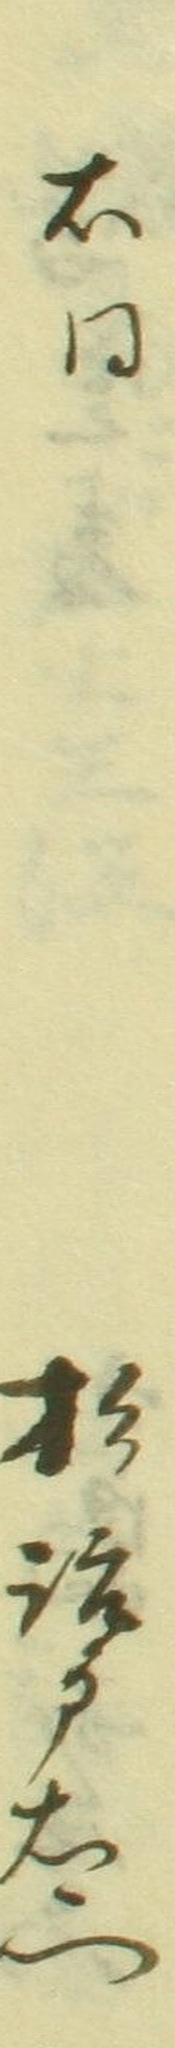右同杉治部右衛門
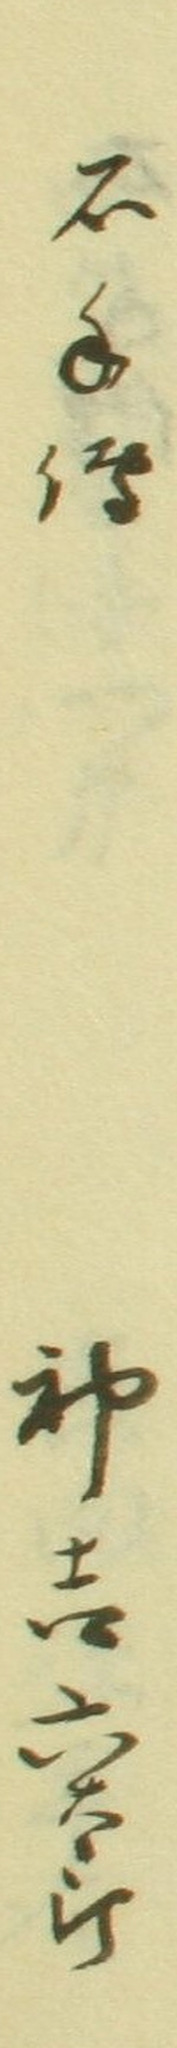右手伝神吉六太郎
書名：唐船漂流記 二
